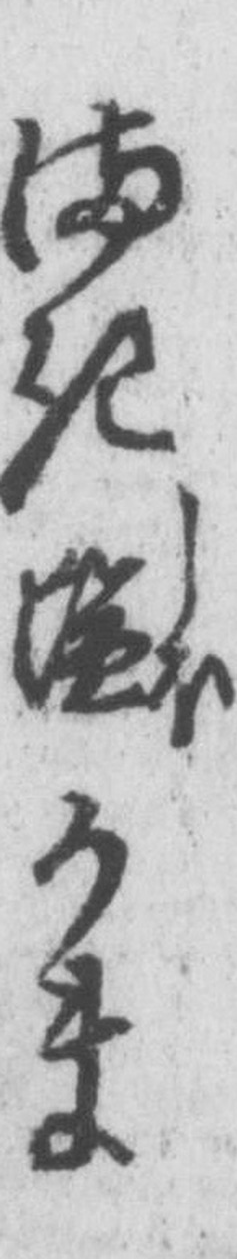まき塩かま
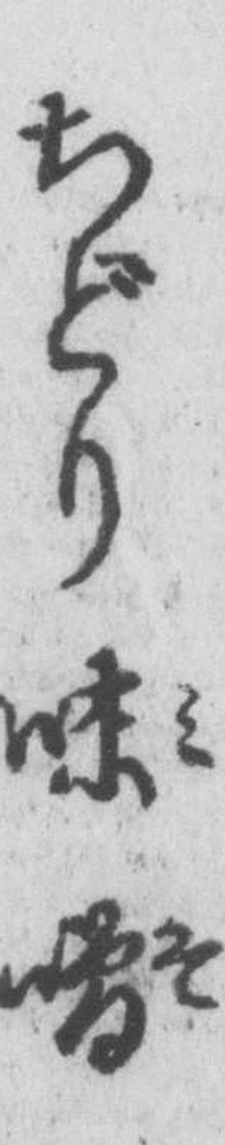ちどり味噌
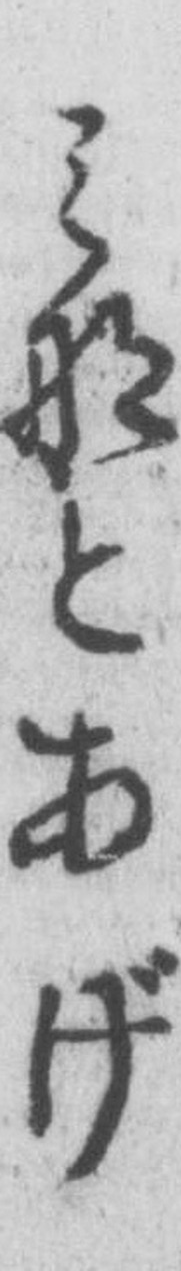ミなとあげ

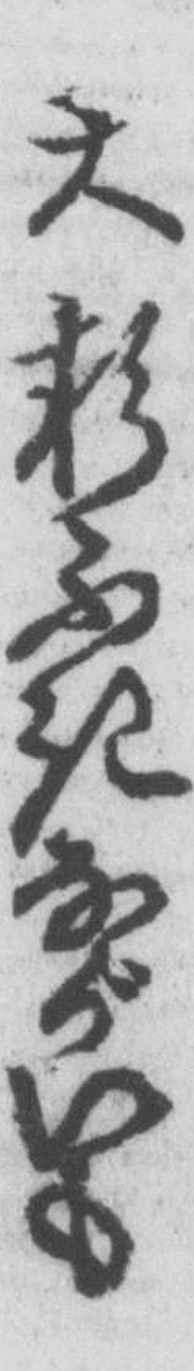大粉ふきながいも
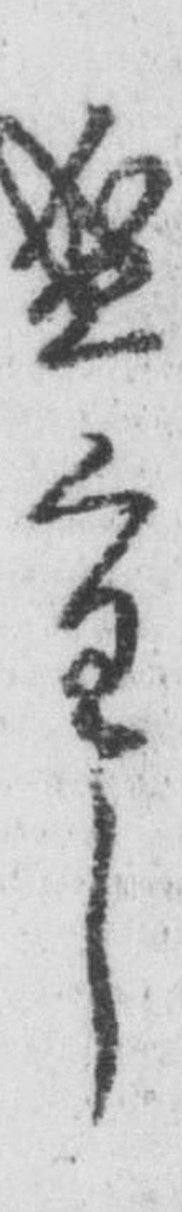盛くわし
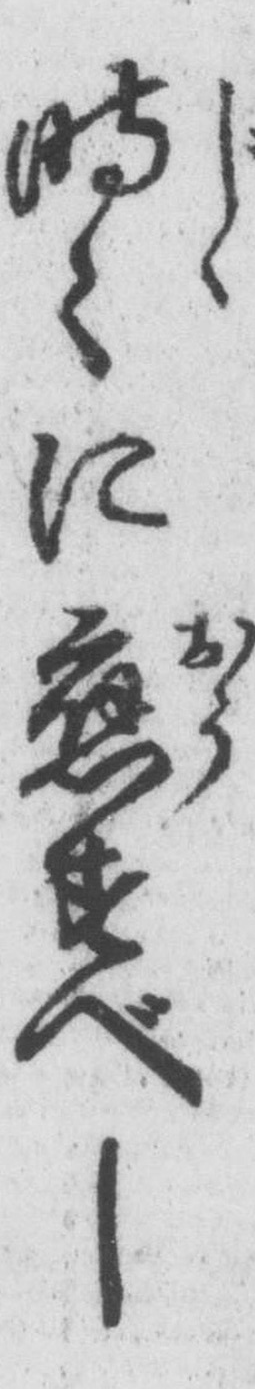時々に應すべし
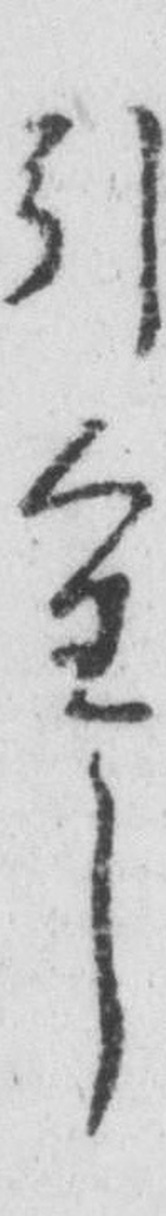引くわし
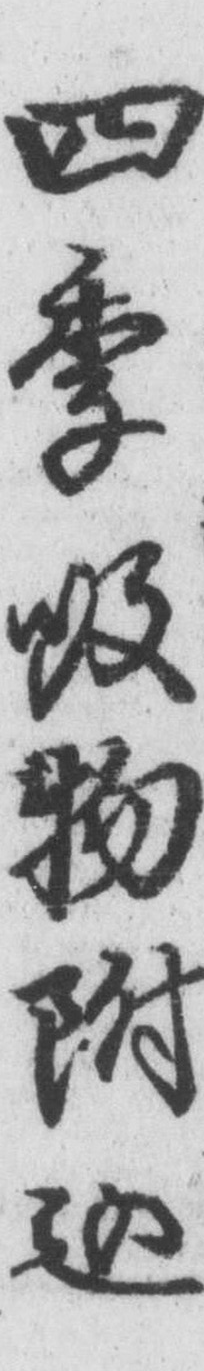四季吸物附込
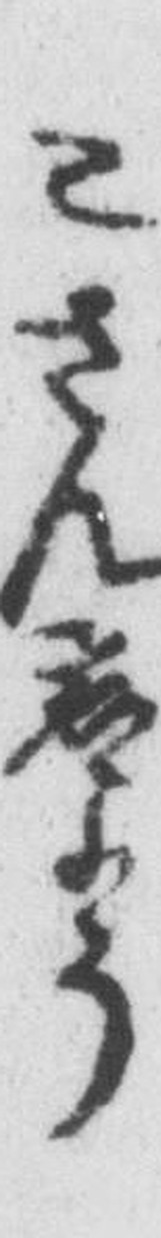こさんしょう
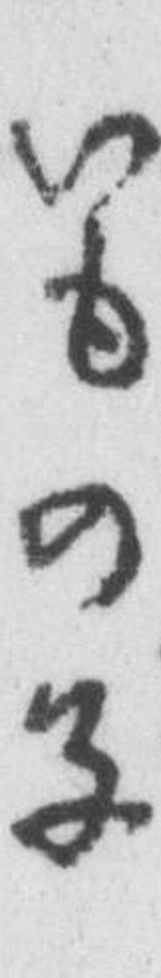いもの子
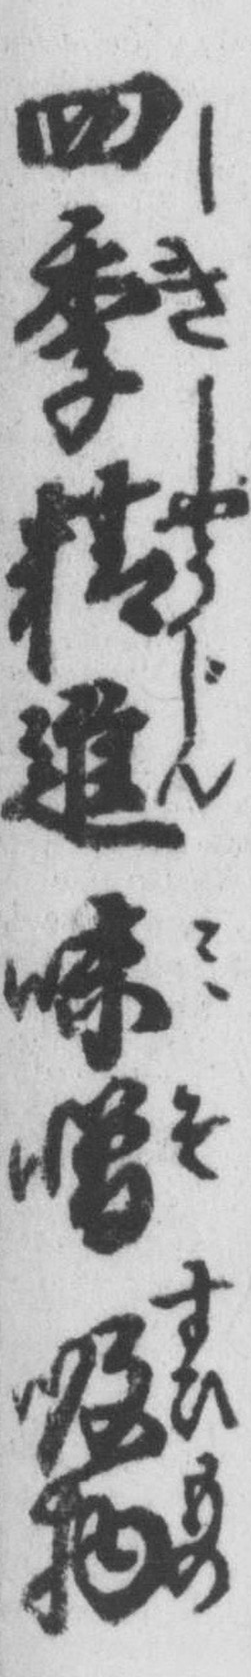四季精進味噌吸物
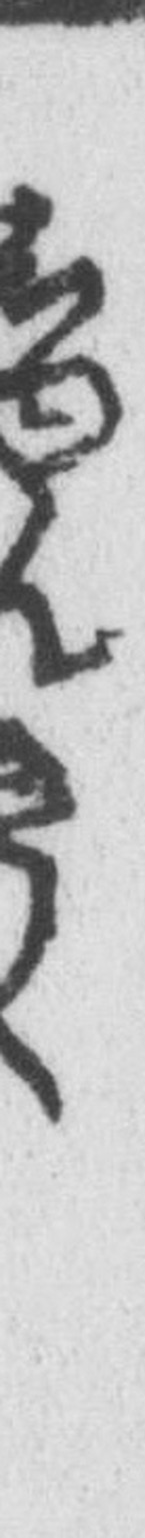しゆんきく
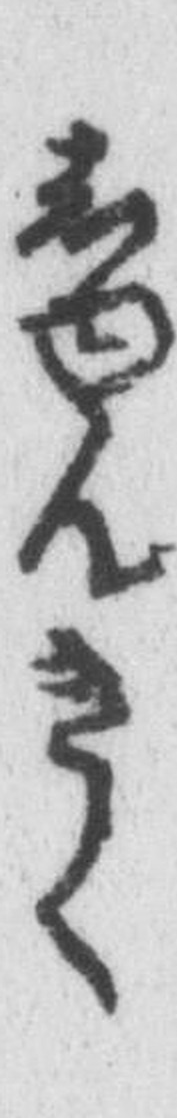しゆんきく
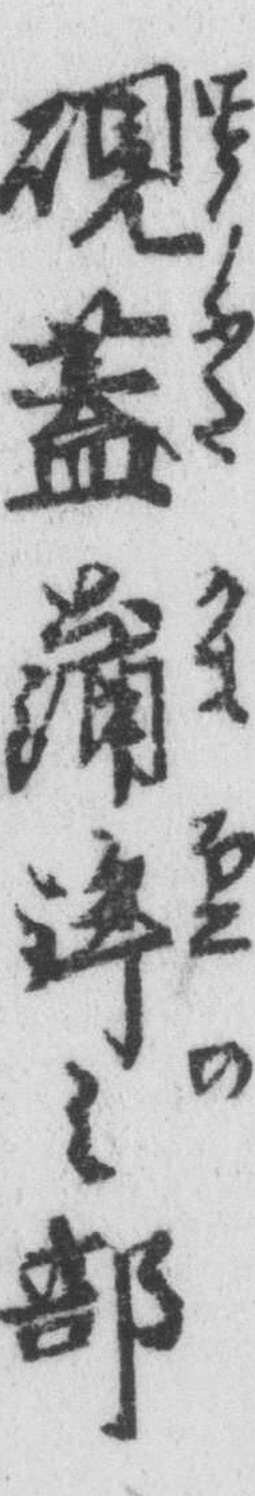硯蓋蒲鉾之部
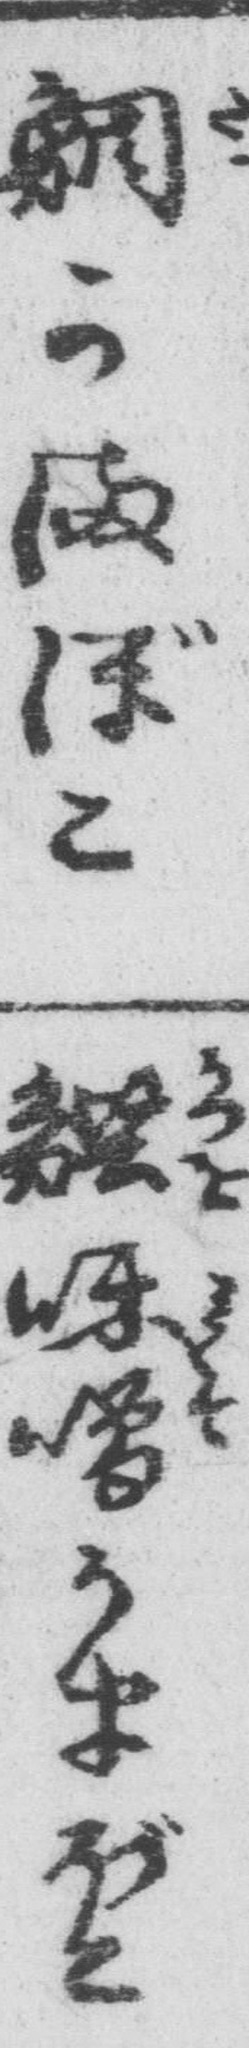鯛かまぼこ鰹味噌かまぼこ
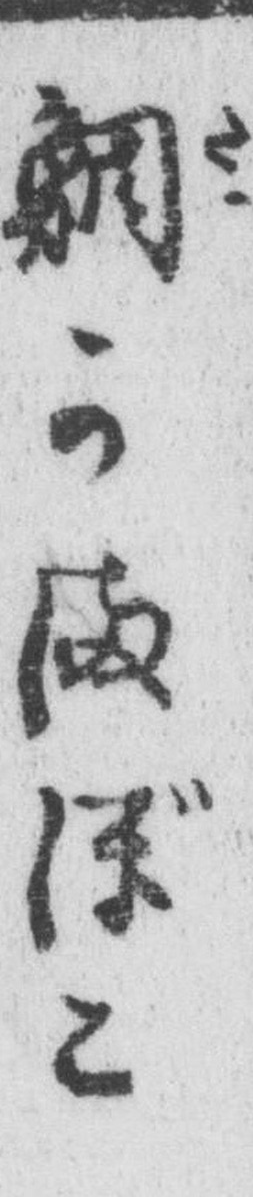鰆かまぼこ
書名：当世料理献立
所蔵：大阪府立大学学術情報センター 国文学研究資料館
